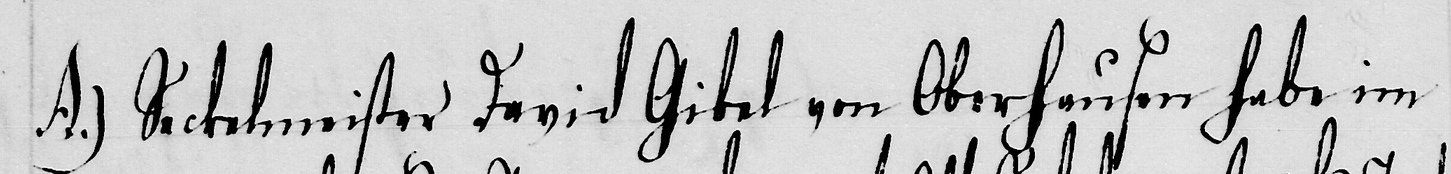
A.) Seckelmeister David Gibel von Oberhausen habe im
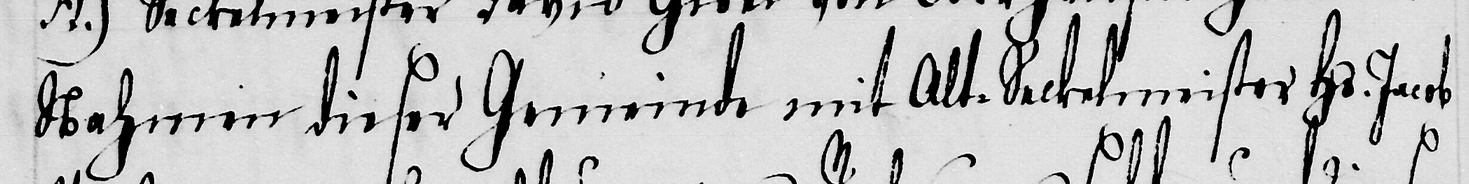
Nahmen dieser Gemeinde mit Alt-Seckelmeister Hs. Ja¬
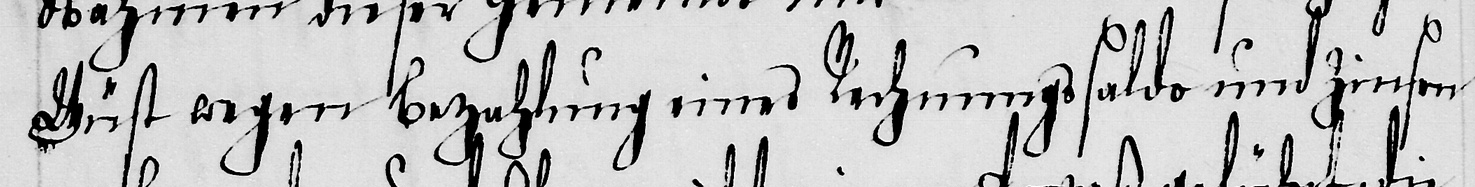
Wüst wegen Bezahlung eines Rechnungssaldo und Zinsen
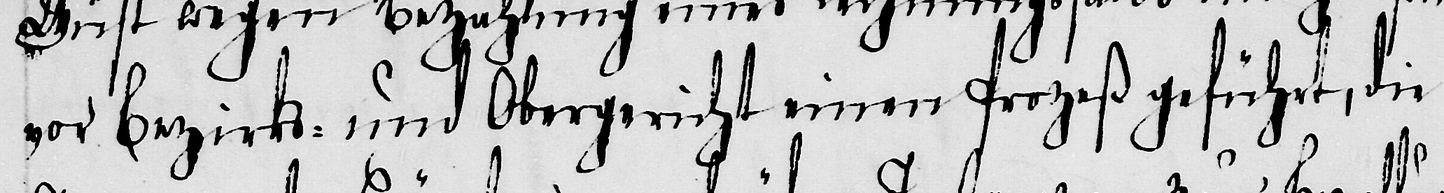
vor Bezirks- und Obergericht einen Prozeß geführt, die
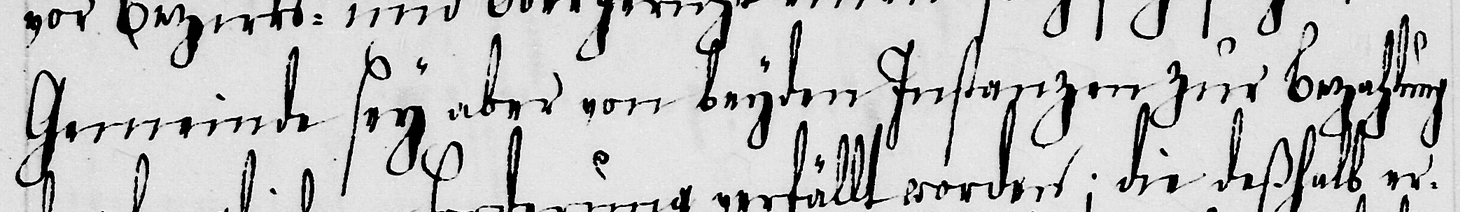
Gemeinde sey aber von beyden Instanzen zur Bezahlung
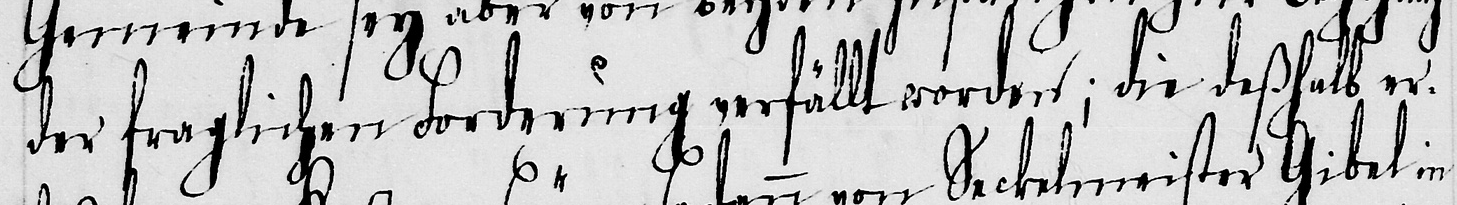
der fraglichen Forderung verfällt worden; die deßhalb er¬
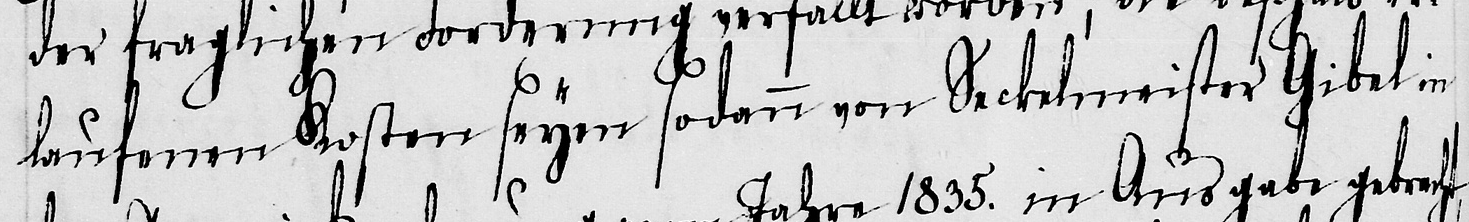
laufenen Kosten seyen sodann von Seckelmeister Gibel in
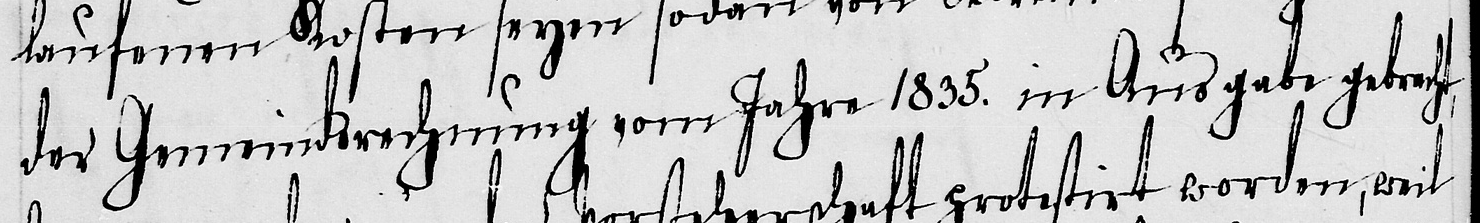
der Gemeindsrechnung vom Jahre 1835. in Ausgabe gebra¬
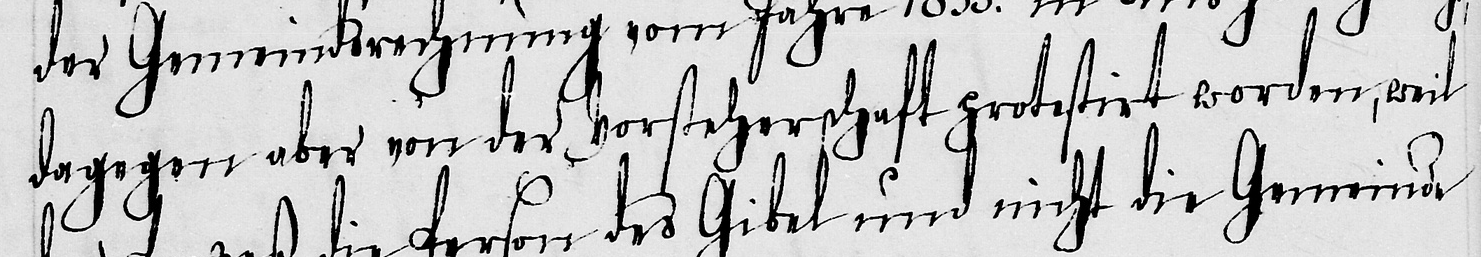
dagegen aber von der Vorsteherschaft protestirt worden, weil
